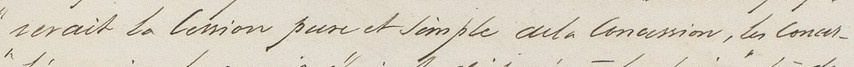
rerait la Cession pure et simple dela Concession, les Conces-
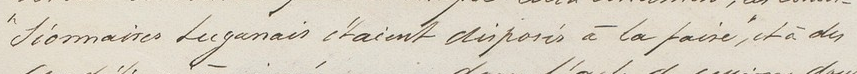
sionnaires Luganais étaient disposés à la faire», et à des
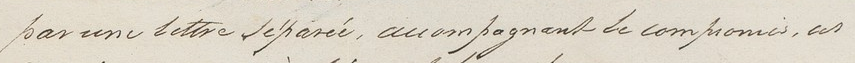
par une lettre séparée, accompagnant le compromis, ces
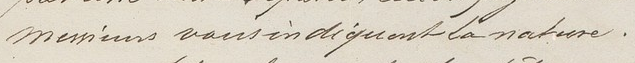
Messieurs vous indiquent la nature.
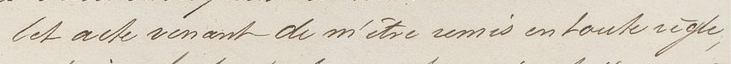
Cet acte venant de m'être remis en toute règle,
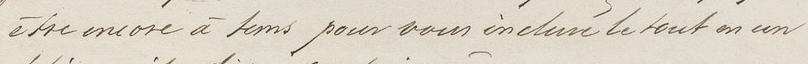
être encore à tems pour vous inclure le tout en un
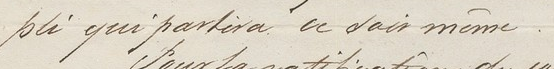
pli qui partira ce soir même.
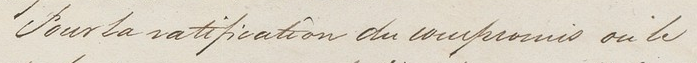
Pour la ratification du compromis ou le
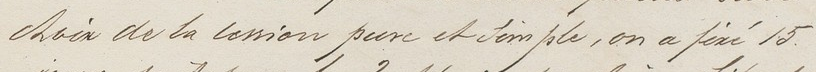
choix de la cession pure et simple, on a fixé 15
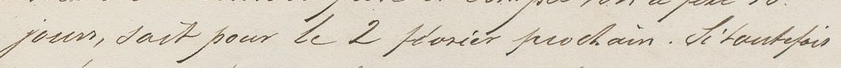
jours, soit pour le 2 février prochain. Si toutefois
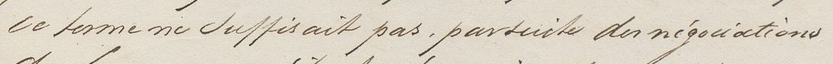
ce terme ne suffisait pas parsuite des négociations
